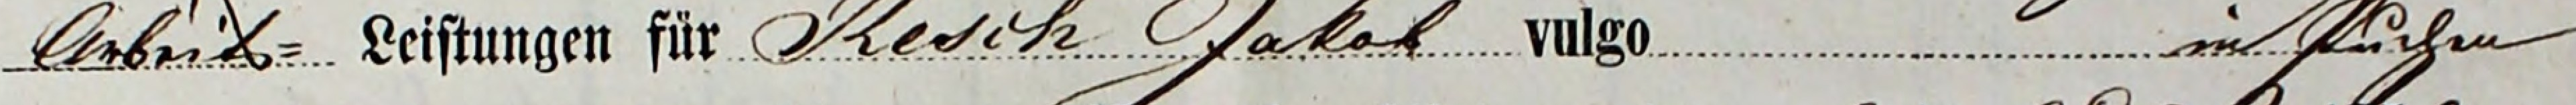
Arbeit = Leistungen für Resch Jakob vulgo in Puchen
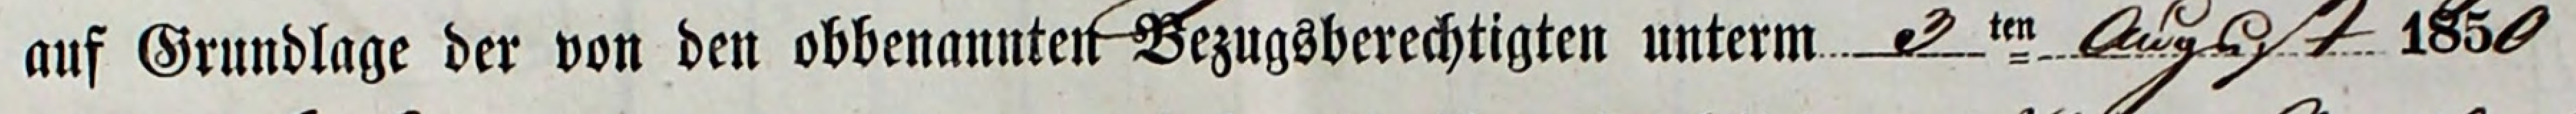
auf Grundlage der von den obbenannten Bezugsberechtigten unterm 3ten August 1850
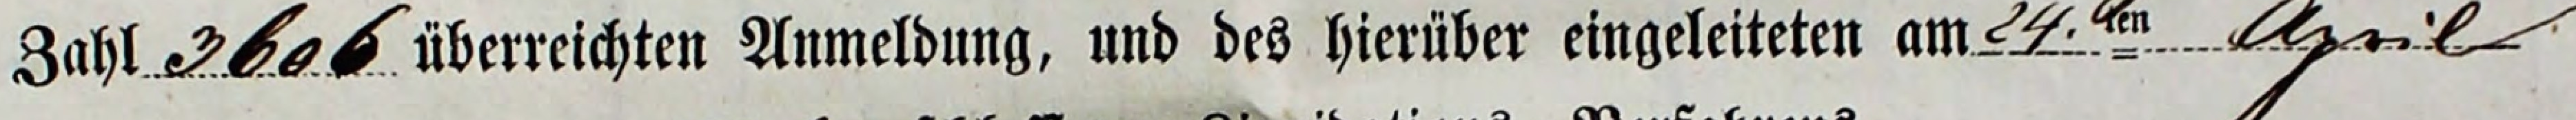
Zahl 3606 überreichten Anmeldung, und des hierüber eingeleiteten am 24ten April
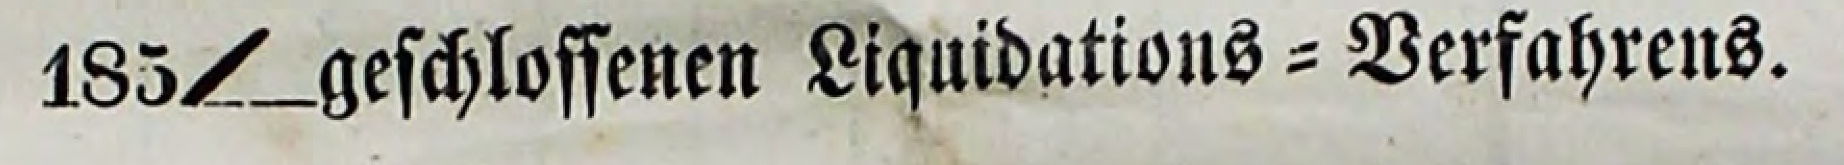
1851 geschlossenen Liquidations = Verfahrens.
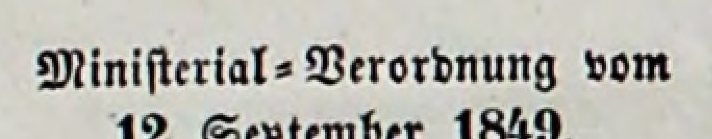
Ministerial = Verordnung vom
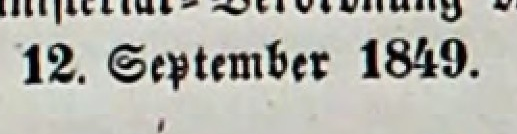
12. September 1849.
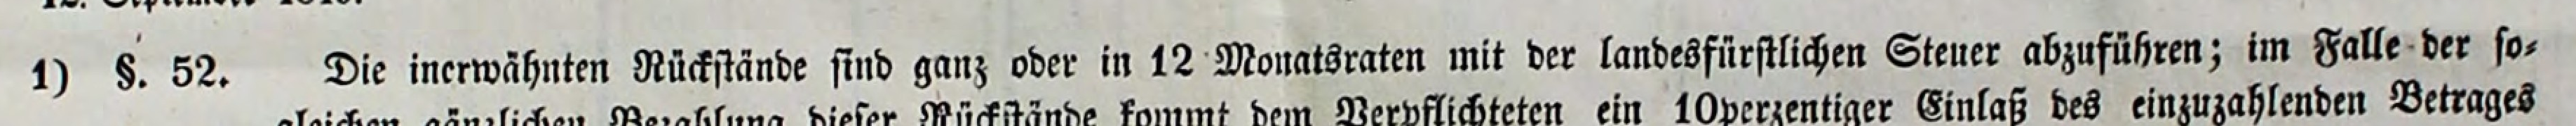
1) §. 52. Die inerwähnten Rückstände sind ganz oder in 12 Monatsraten mit der landesfürstlichen Steuer abzuführen; im Falle der so=
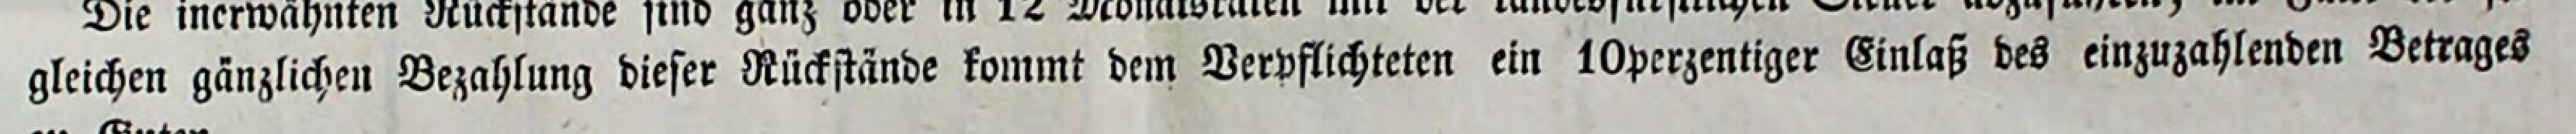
gleichen gänzlichen Bezahlung dieser Rückstände kommt dem Verpflichteten ein 10perzentiger Einlaß des einzuzahlenden Betrages
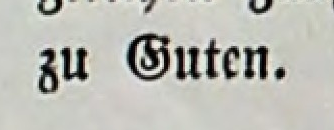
zu Guten.
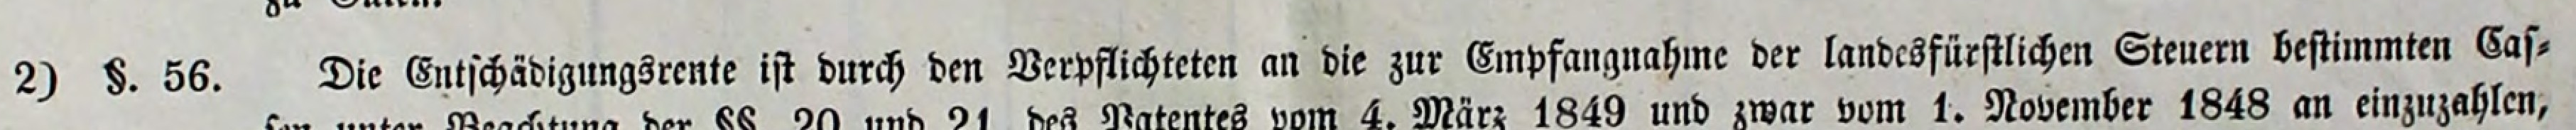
2) §. 56. Die Entschädigungsrente ist durch den Verpflichteten an die zur Empfangnahme der landesfürstlichen Steuern bestimmten Cas=
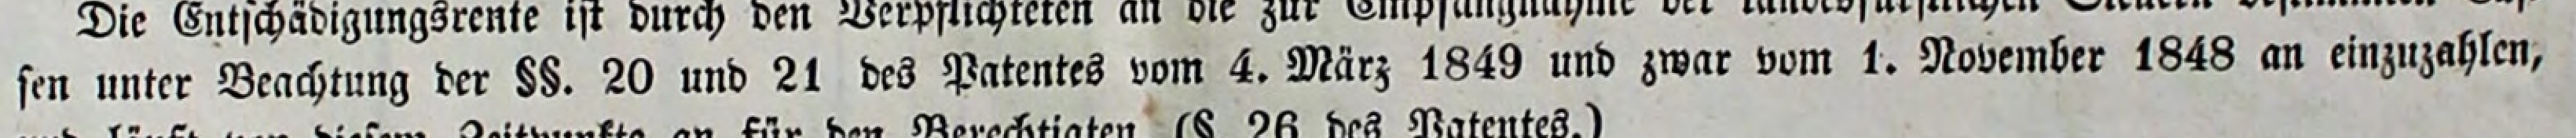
sen unter Beachtung der §§. 20 und 21 des Patentes vom 4. März 1849 und zwar vom 1. November 1848 an einzuzahlen,
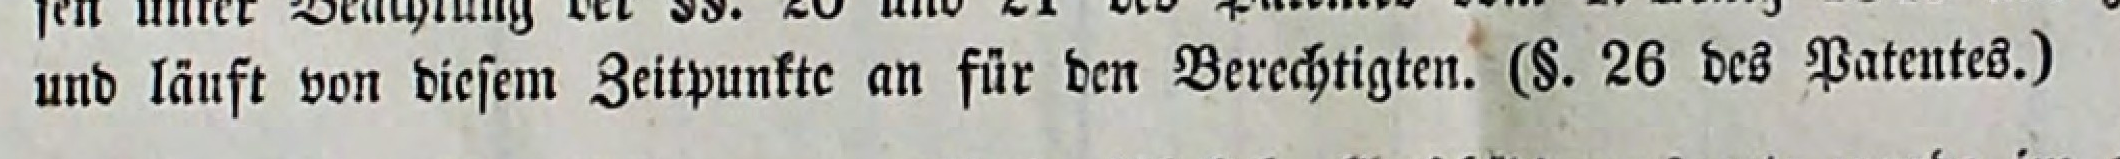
und läuft von diesem Zeitpunkte an für den Berechtigten. (§. 26 des Patentes.)
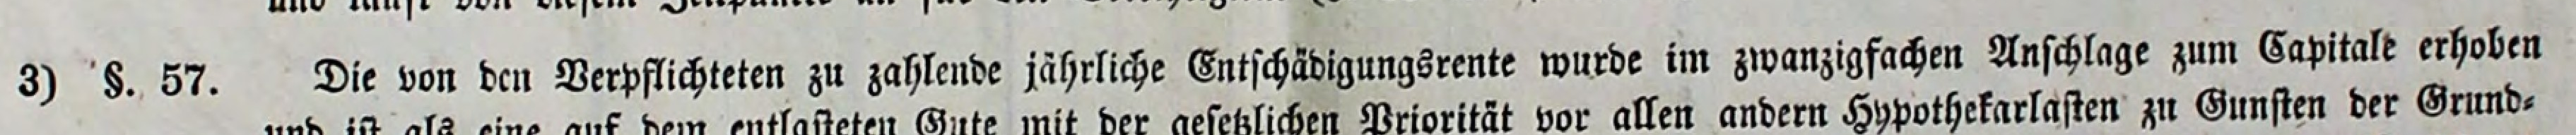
3) §. 57. Die von den Verpflichteten zu zahlende jährliche Entschädigungsrente wurde im zwanzigfachen Anschlage zum Capitale erhoben
